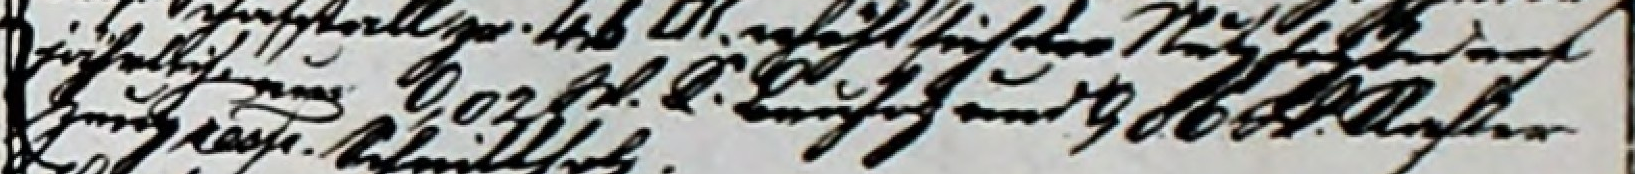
jährliche um 0,02 W. K. Bauholz und 0,06 Kaster
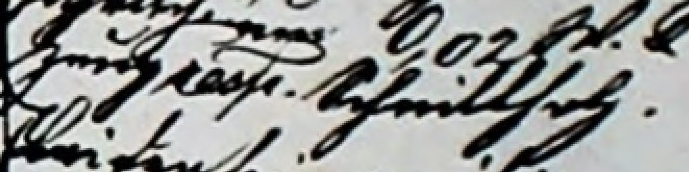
zeug resp. Schnittholz.
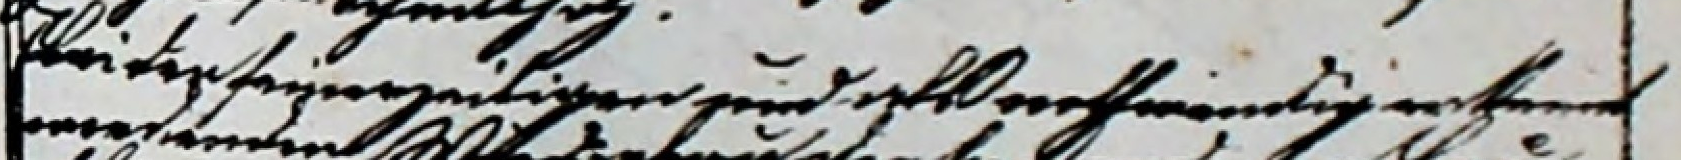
Bei der seiner zeitigen und als notwendiger kennt
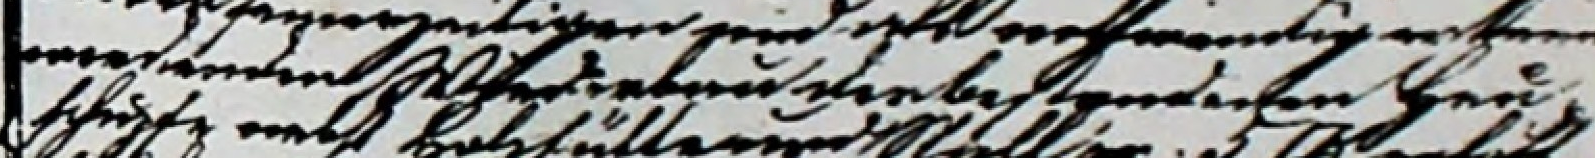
werdenden Wiederbau der bestandenen Hau„
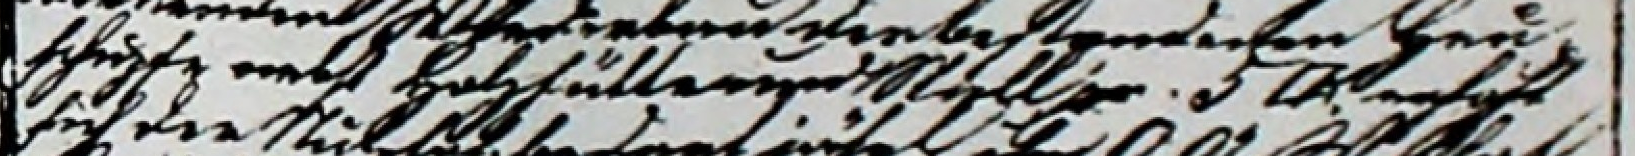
schupfe nebst Holzhütter und Staller. 5 K, erhält
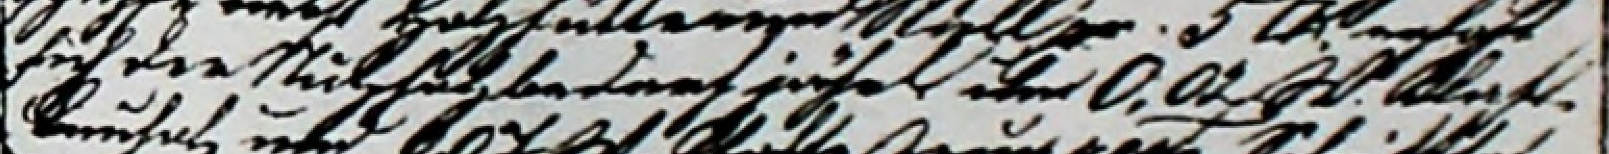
sich der Nutzbedarf jährl. um 0,02 W. Klaste
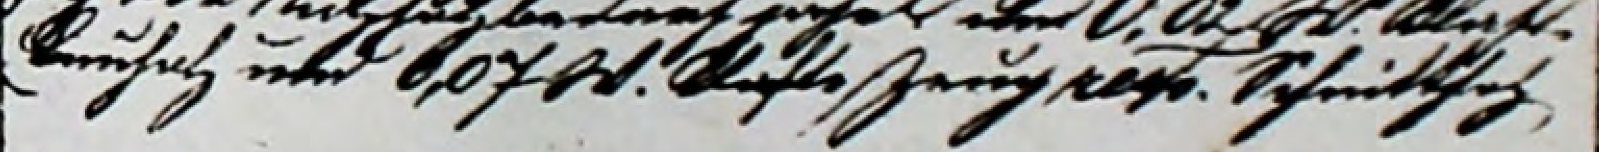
Bauholz und 6,07 W. Kaste Zeug resp. Schnittholz
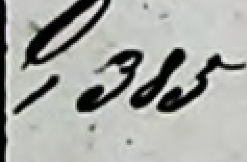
0,385
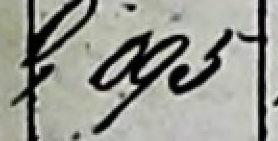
0,095
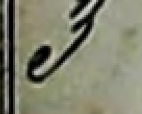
3
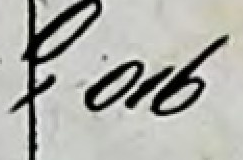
0,016
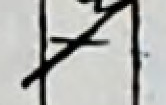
7
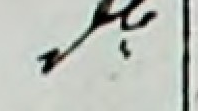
Do
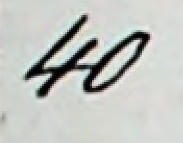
40
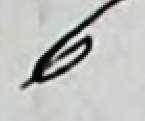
6
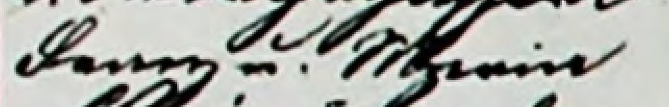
Franz u. Maria
